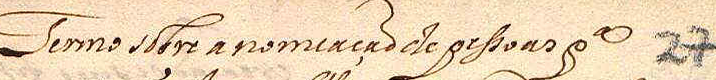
Termo sobre a nomeaçaõ de pessoas pa
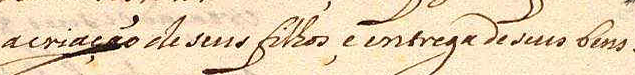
a criaçaõ de seus filhos, e entrega de seus bens
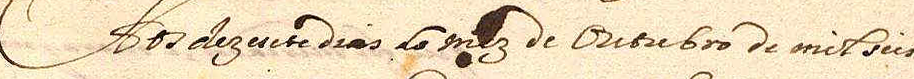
Aos dezesete dias do mez de Outubro de mil seis
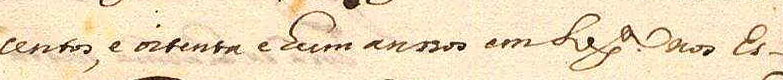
centos, e oitenta e hum annos em Lxa. nos Es
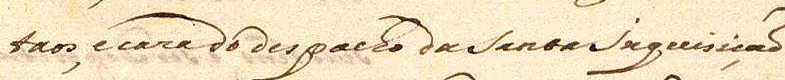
taos, e caza do despacho da Santa Inquisiçaõ
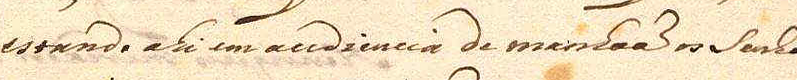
estando ahi em audiencia de manhaã os Senho
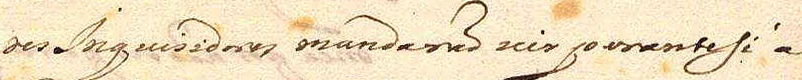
res Inquisidores mandaraõ uir perante si a
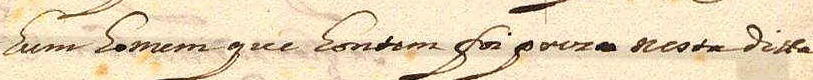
hum homem que hontem foi prezo nesta ditta
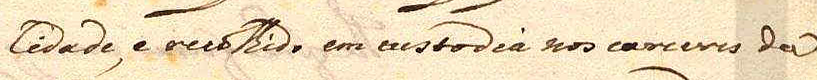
Cidade, e recolhido em custodia nos carceres da
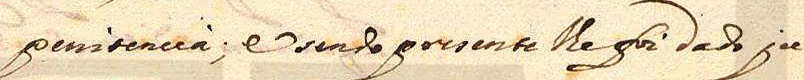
penitencia; e sendo presente lhe foi dado ju
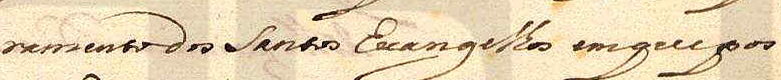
ramento dos Santos Euangelhos em que pos
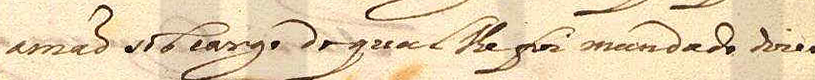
a maõ sob cargo do qual lhe foi mandado dizer
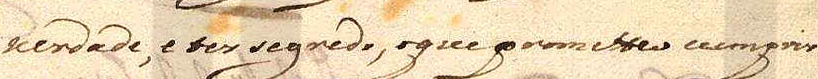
uerdade, e ter segredo, o que prometteo cumprir.
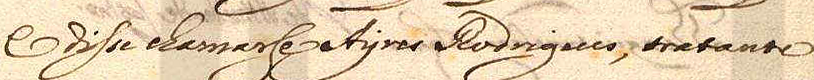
E disse chamarse Ayres Rodrigues, tratante
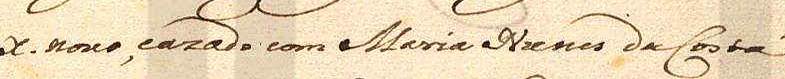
x. nouo, cazado com Maria Nunes da Costa
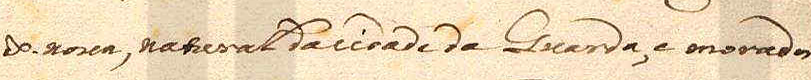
x. noua, natural da cidade da Guarda, e morador
